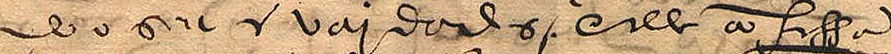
do o seu ē vajdades /. e elle c̄ofessā
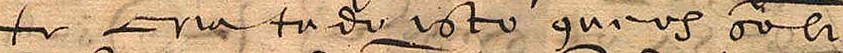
te cria tudo isto que os s̄obr
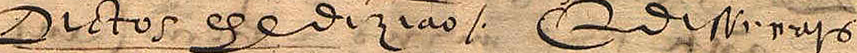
Dictos lhe dizião /. E disse majs
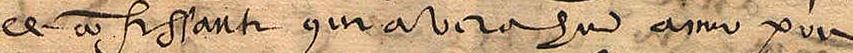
elle cōfessante que avera hū anno pou
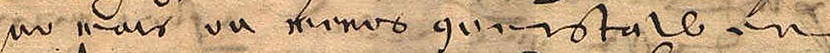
quo mais ou menos que estādo en
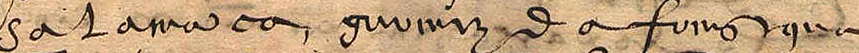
SaLamāca, guomez da fomsequa
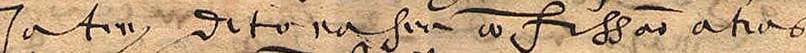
q̄ Ja tem dito na sua c̄ofissão atras
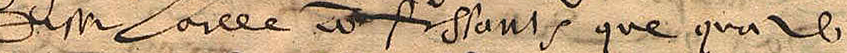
Disse a elle cōfessantꝭ que quādo
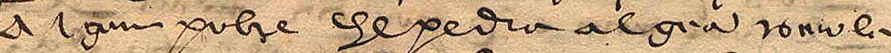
algum pobre lhe pedia alguā esmola
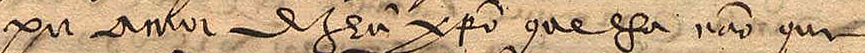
por amor de Jhū xpō que lha não que
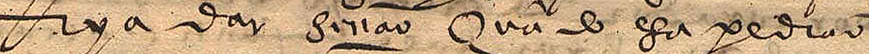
rya dar senão Quādo lha pediaõ
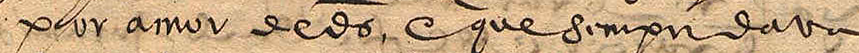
por amor de d̄s, e que semper dava
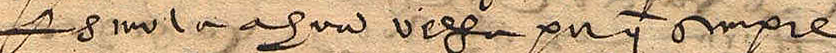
esmola a huā velha porq̄ sempre
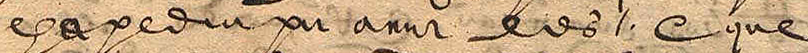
lha pediu por amor de ds̄ /. e que
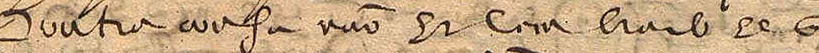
Doutra cousa naõ he lembrado he q̄
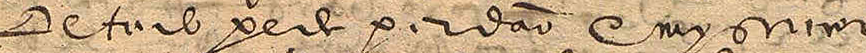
De tudo pede perdão e mysericor
